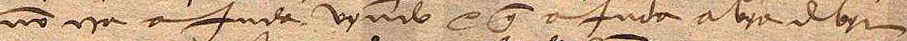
n̄o era aJnda vyndo e q̄ aJnda avya de vyr
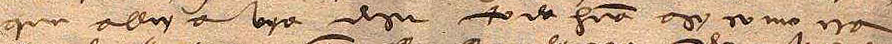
e que a lley avya de ser toda hūa asy como era
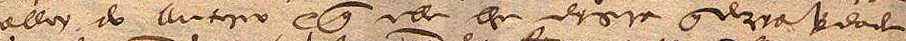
a lley do llutereo e q̄ elle lhe dysera q̄ dezya ꝟdade
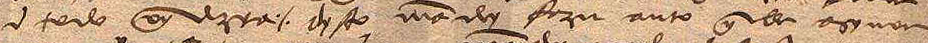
ē todo o q̄ dezya ./. dysto m̄adey fazer auto q̄ elle asynou
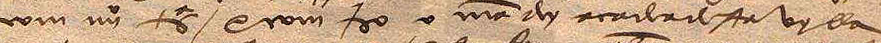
com iiijo tas / e com Jso o m̄adey a cadea desta vylla
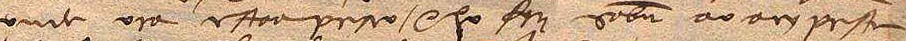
onde ora estaa preso / e ho fyz sāber ao acypreste
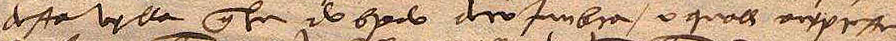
desta vylla q̄ he do bpdo de coJmbra / o quall acypreste
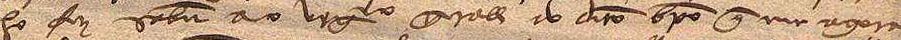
ho fez sāber ao vygro gerall do dīto b̄po q̄ me agora
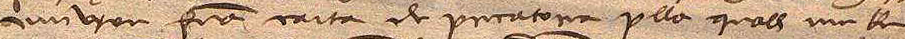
emvyou hūa carta deprecatoria plla quall me Re
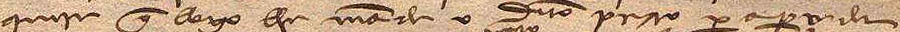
quere q̄ llogo lhe m̄ade o dīto preso ꝑa ꝑçeder
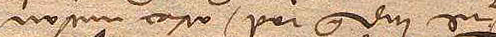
no seu caso / por q̄ diz ser
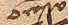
o caso
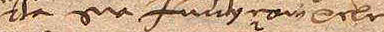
da sua Jurdyçam ecle
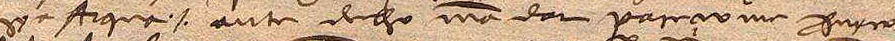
syastiqua ./. ante de lho m̄adar pareçeo me ꞩuyco
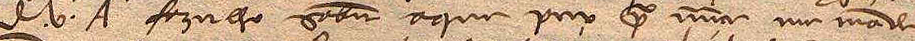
de .v. A fazer lho sāber a que peço p̄o m̄çee me māde
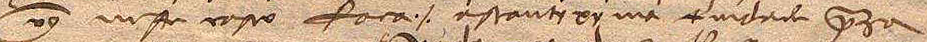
o q̄ neste casso faça ./. a ssantyxyma timdade p̄za
